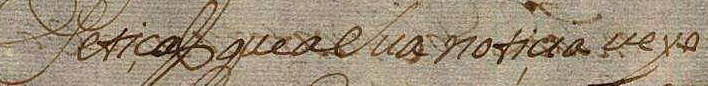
Petiçaõ que a sua noticia ueyo
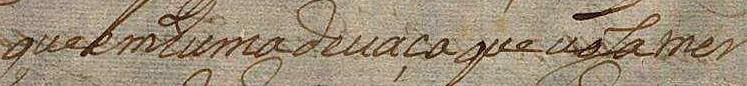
que em huma deuaça que uosa mer
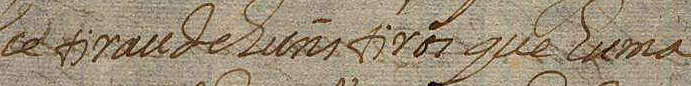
ce tirou de hun̄s tiros que huma
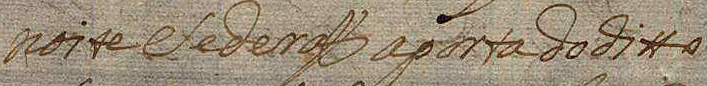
noite se deraõ a porta do ditto
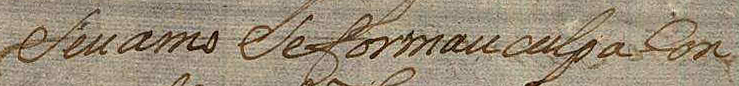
seu amo se formou culpa con
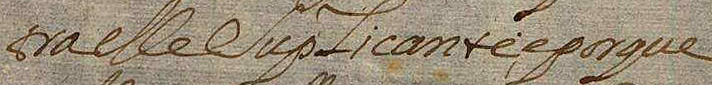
tra elle supLicante; e porque
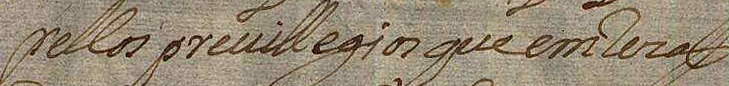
pellos preuillegios que em Rezaõ
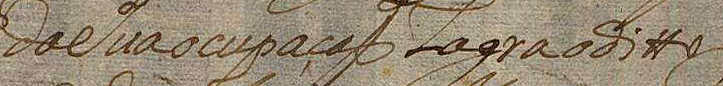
da Sua ocupaçaõ Logra o ditto
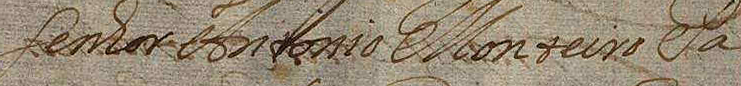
senhor Antonio Monteiro Pa
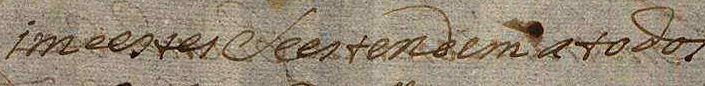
im e estes se estendem a todos
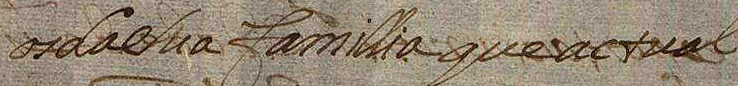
os da sua famillia que actual
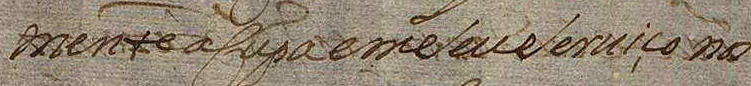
mente oCupa em seu seruiço nos
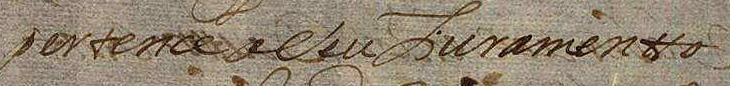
pertence o seu Liuramentto
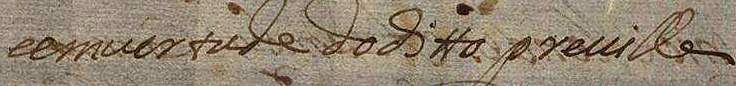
e em uertude do ditto preuille
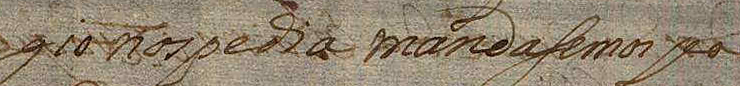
gio nos pedia mandasemos pa
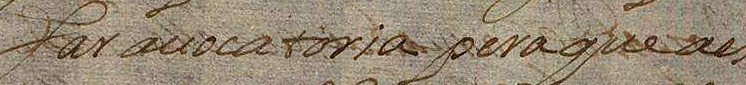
sar auocatoria pera que a es
